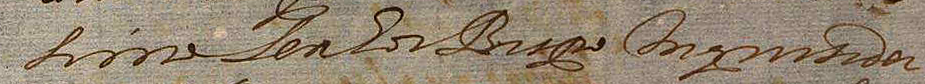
simo Senhor Bispo Inquisidor
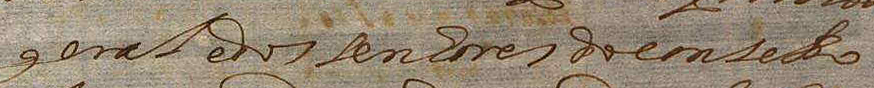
geral e dos senhores do conselho
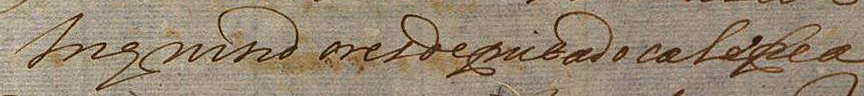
Inquisidores deputado calefica
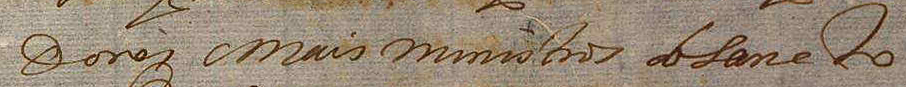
dores e mais ministros do sancto
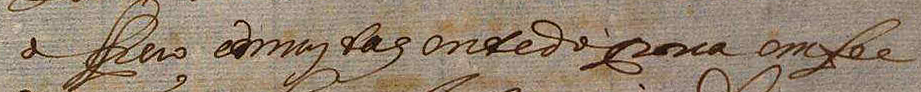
oficio e mujta gente do pouo em fee
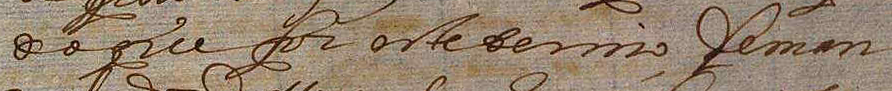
do que fiz este termo de man
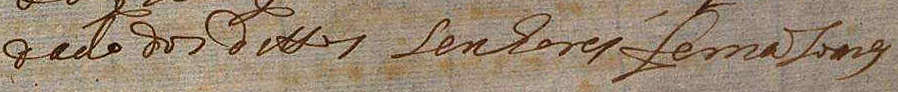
dado dos dittos Senhores fernaõ Soares
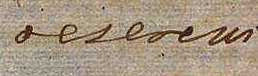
o escreui
